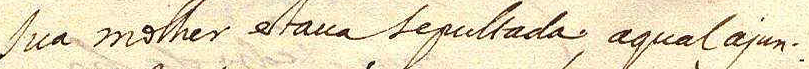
sua molher estaua sepultada, a qual ajun
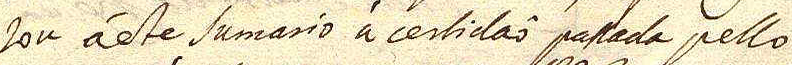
tou á este sumario á certidaõ pasada pello
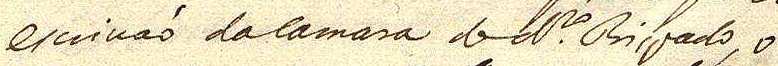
escriuaõ da camara do d.to Bispado, ó
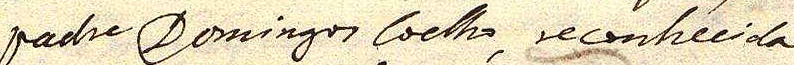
padre Domingos Coelho, reconhecida
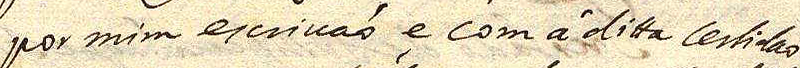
por mim escriuaõ e com á ditta certidaõ
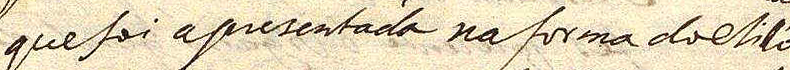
que foi aprezentada na forma do estillo
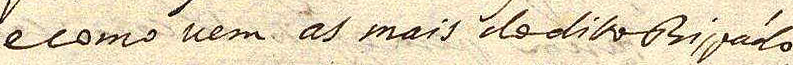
e como uem as mais do ditto Bispado,
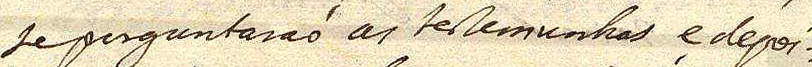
se perguntaraõ as testemunhas e, depoi
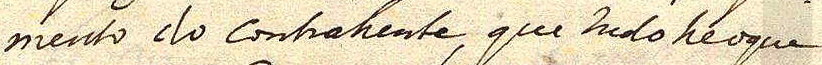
mento do contrahente, que tudo he o que
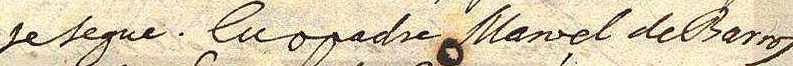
se segue. Eu o padre Manoel de Barros
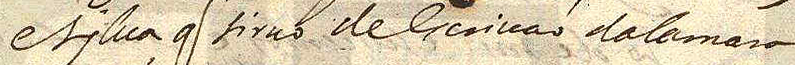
e sjlua, q̄ siruo de Escriuaõ da Camara
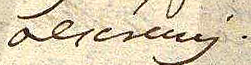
o escreuy.
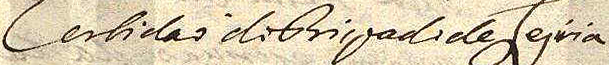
Certidaõ do bispado de Lejria
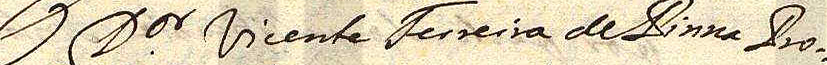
O D.or Vicente Ferreira de Pinna Pro
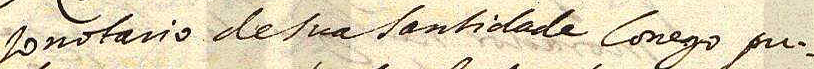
to notario de Sua Santidade Conego pre
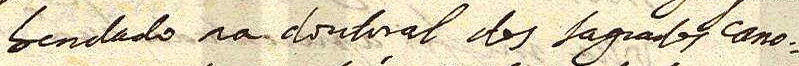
bendado na doutoral dos sagrados cano
